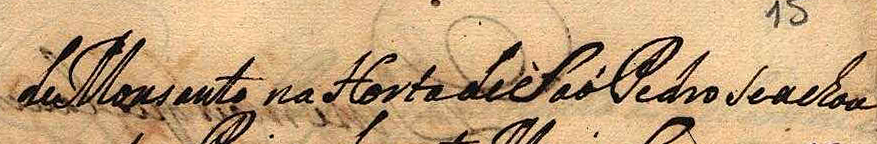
de Monsanto na Horta de Saõ Pedro se achou
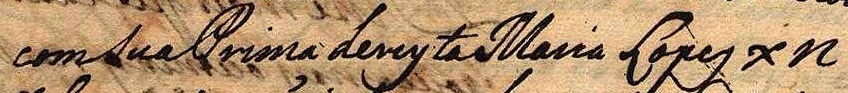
com Sua Prima dereyta Maria Lopes xn
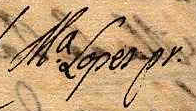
M.a Lopez pr.
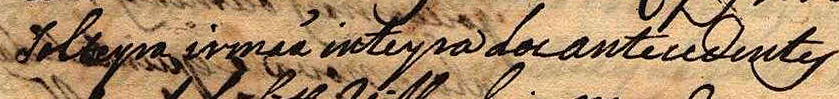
solteyra irmaã inteyra dos antecedentes
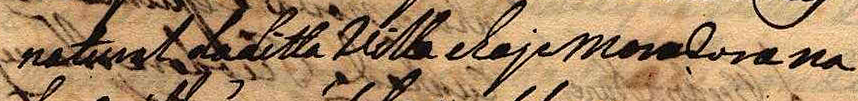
natural da ditta Villa e hoje moradora na
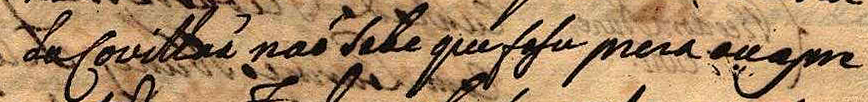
da Covilhaã naõ sabe que fosse preza ou apre
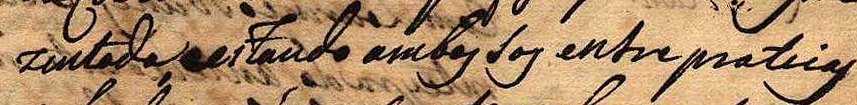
zentada, e estando ambos sos entre praticas
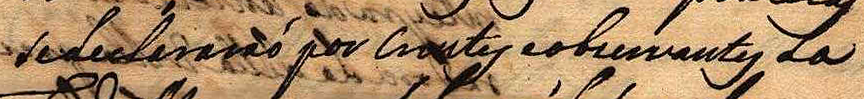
se declararaõ por crentes e observantes da
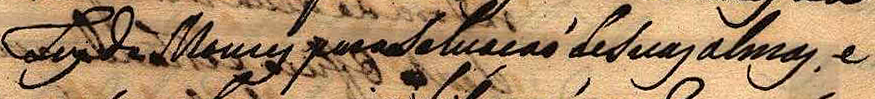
Ley de Mouzes para Saluaçaõ de suas almas, e
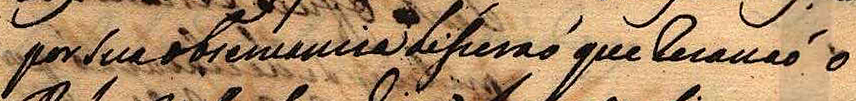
por sua obseruancia disseraõ que Rezauaõ o
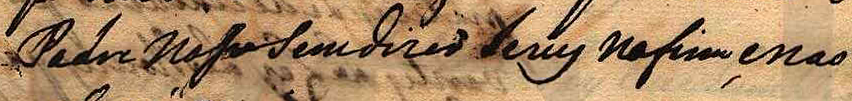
Padre nosso sem dizer Iezus no fim, e nao
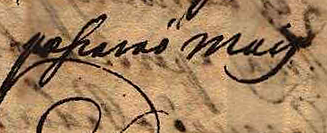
passaraõ mais.
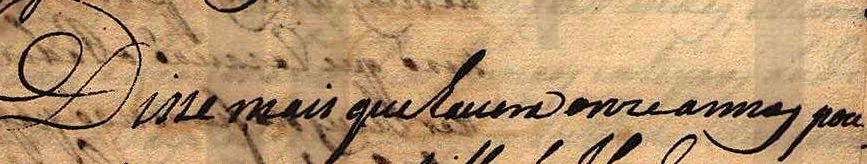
Disse mais que hauera onze annos pou
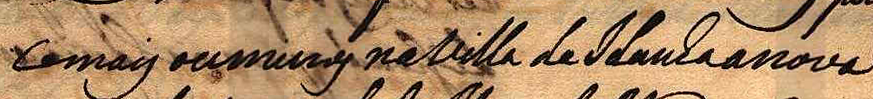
co mais ou menos na Villa de Idanha a nova
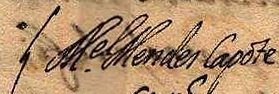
L M.el Mendes Capote
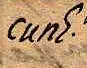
cunh.
